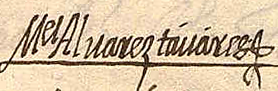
Mel Aluarez tauares
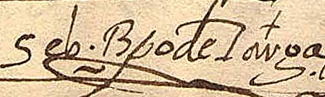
Seb. Bpo de Targa
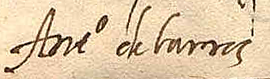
Anto de barros
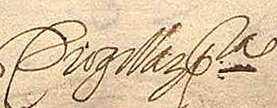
Diogo Vaz p.ra
